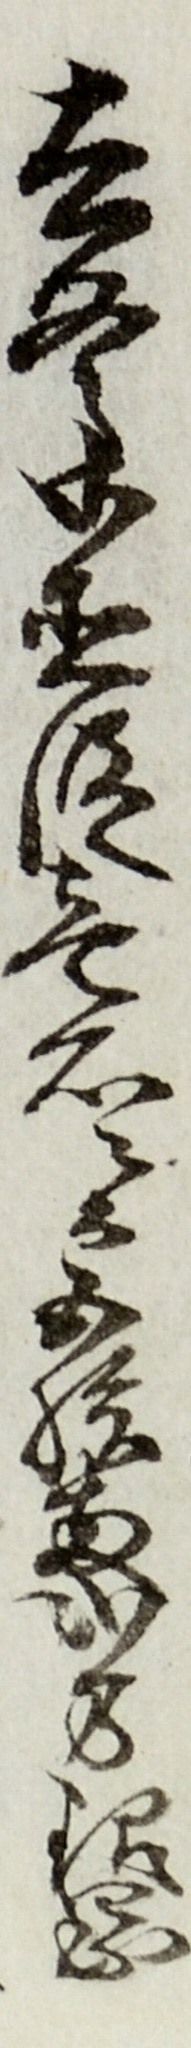去冬御直段壱石ニ而五拾両弐分銀四匁
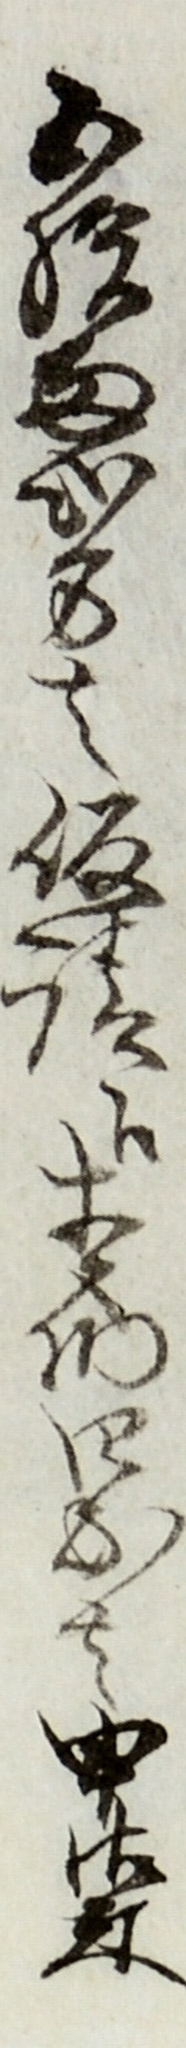五拾両弐分者仮請江相納四匁者申御米
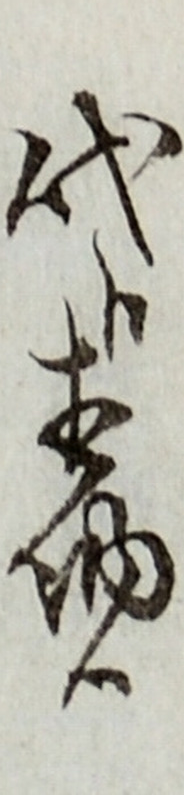代江相納候
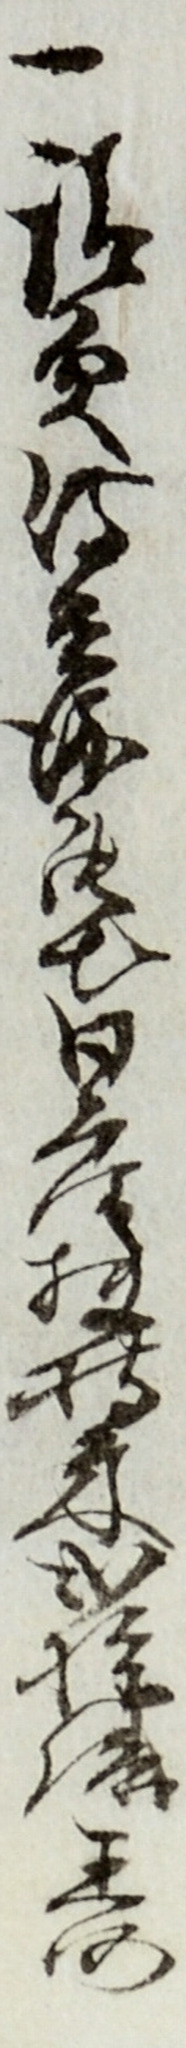一請負伝兵衛罷出日雇扶持米弐拾俵黒河
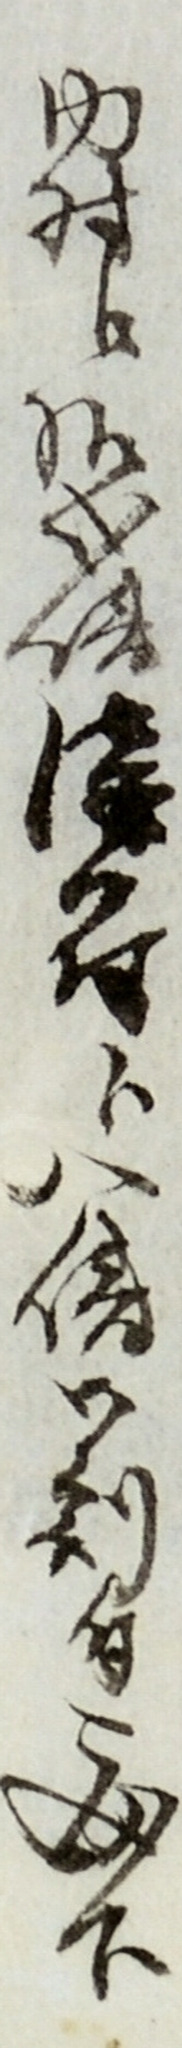内村江拾弐俵漆口村江八俵御割付被成下
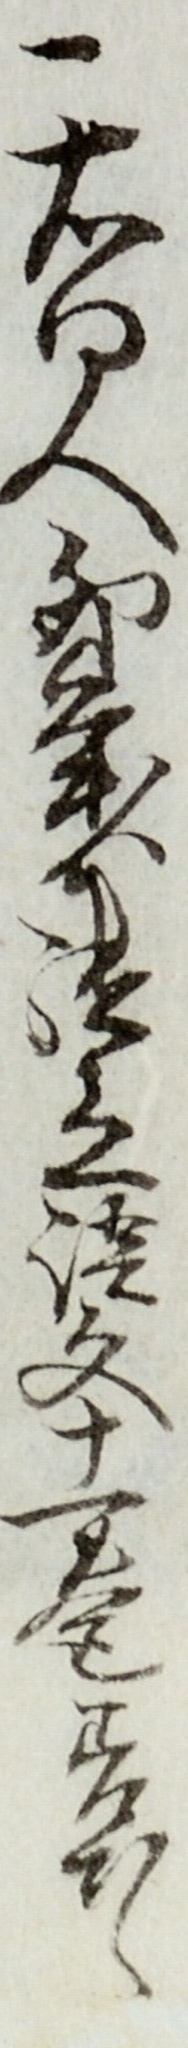一右同人卯年ゟ継立証文十一巻差出候
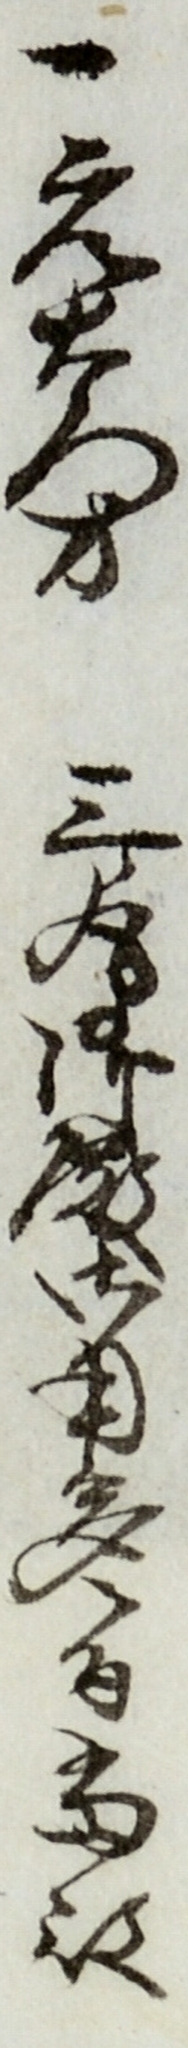一元右衛門方三ノ丸御殿御用多ニ付当役
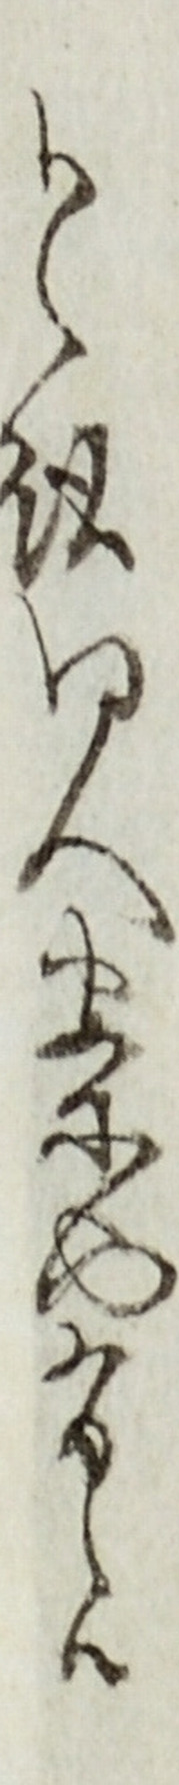候之趣同人案内有之候
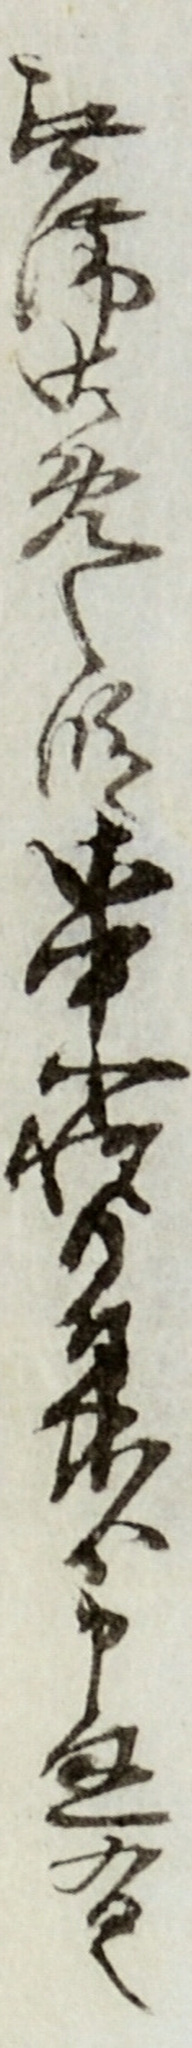無滞御免之段御中小性目付中ゟ申通有之
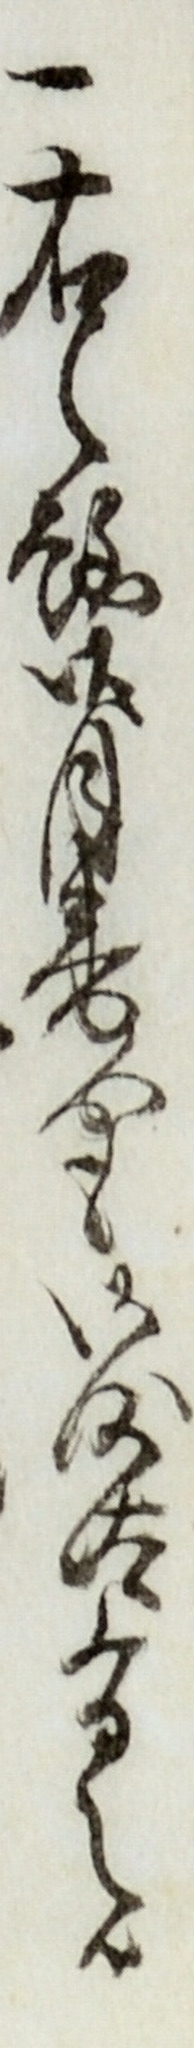一右之趣御月番ゟも御沙汰有之候
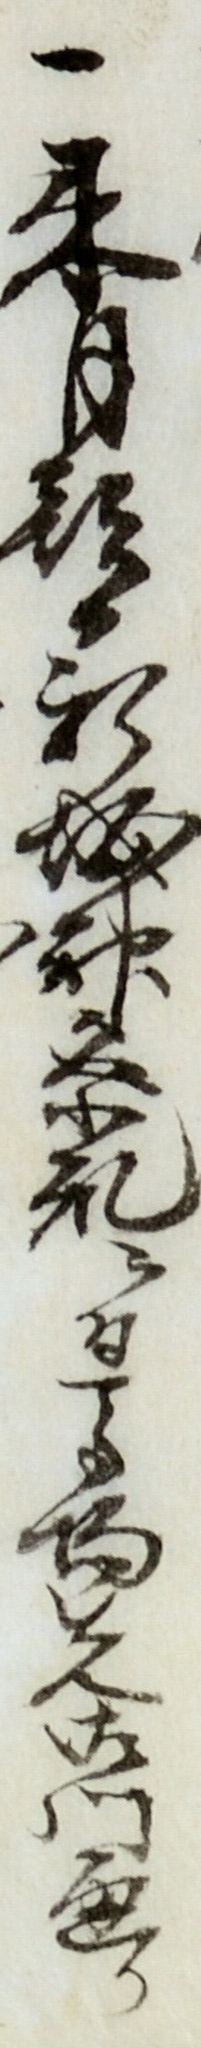一来月朔日新城神祭礼ニ付馬場先御門通り
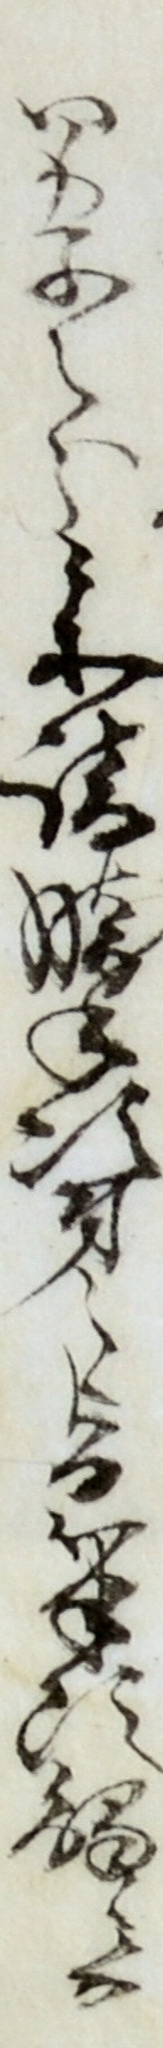男子之分参詣勝手次第之旨筆頭触ニ而

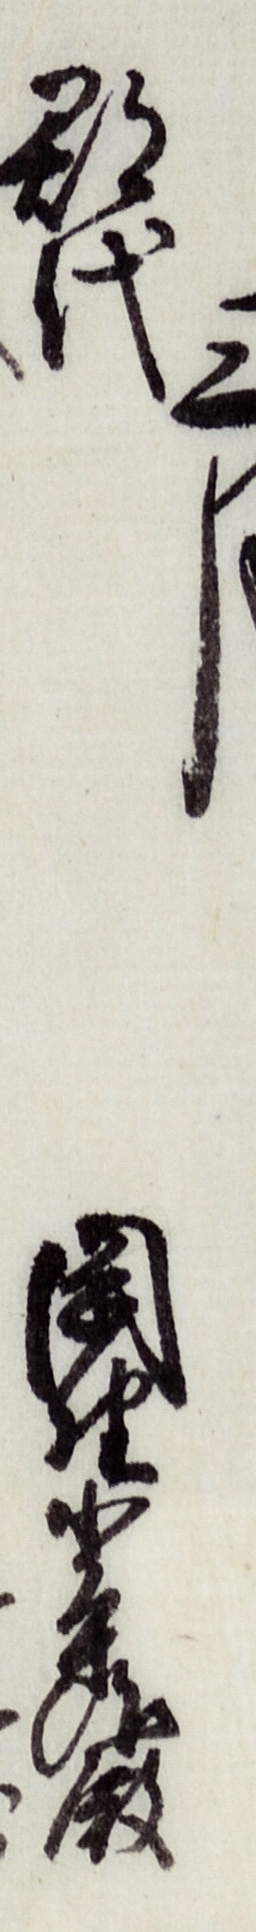郡代岡野小平治殿
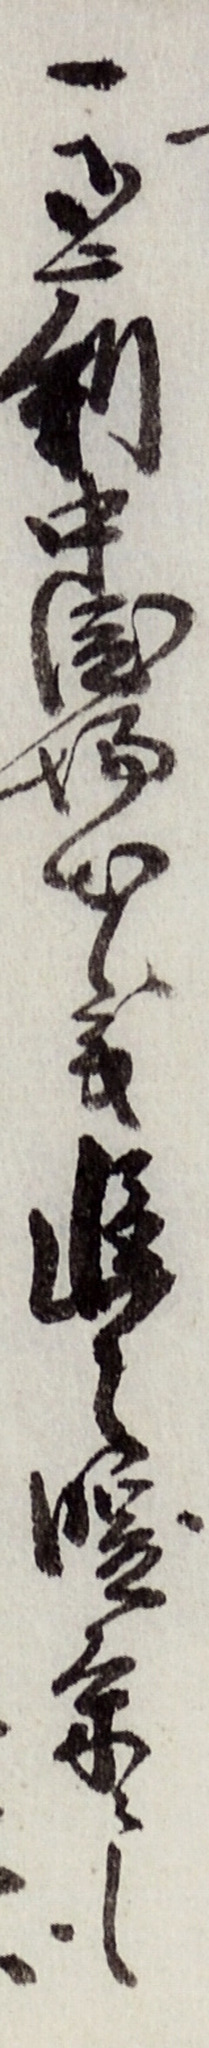一御薪中渡場出候義追々暖気ニも
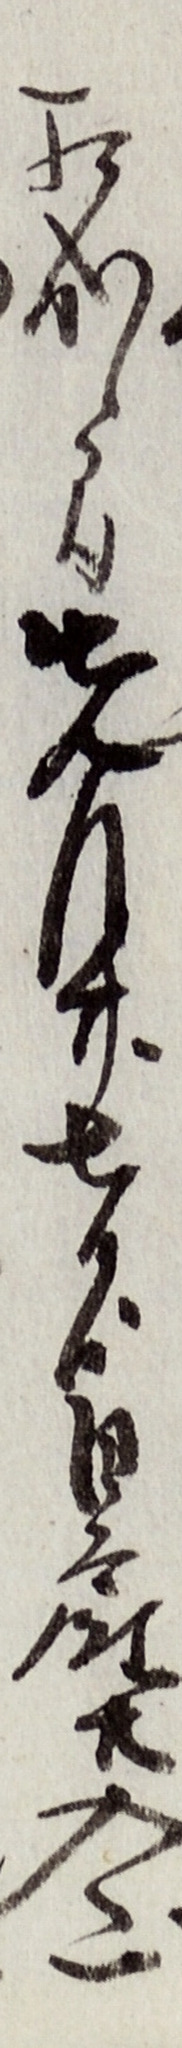相成候間先月廿七日ゟ日雇共入山
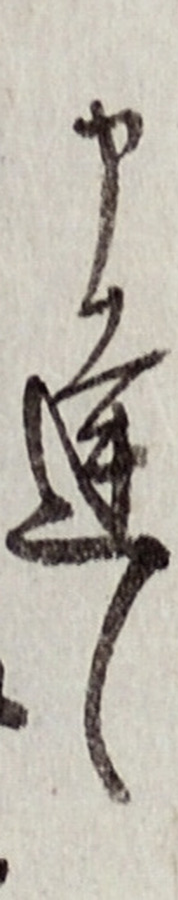申達候
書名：御山方御薪方諸事御用留
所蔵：伊那市立高遠町図書館・合同会社AMANE
